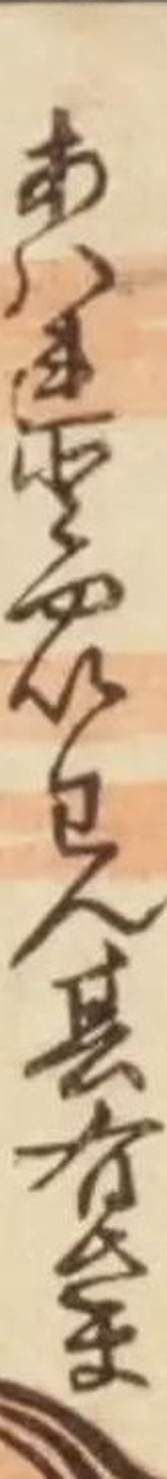あはれとやいわん其有さま
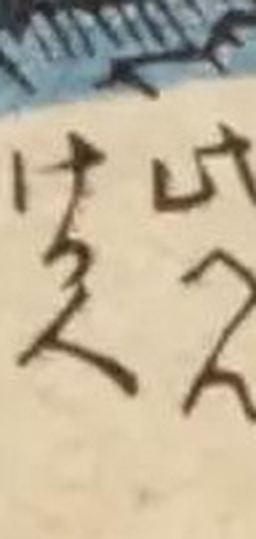けか人
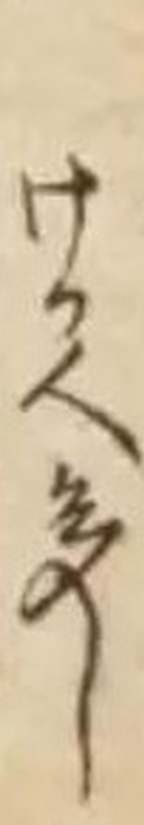けか人多し
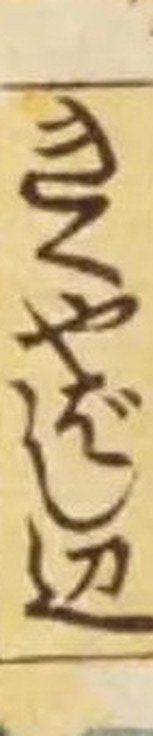きくやばし辺
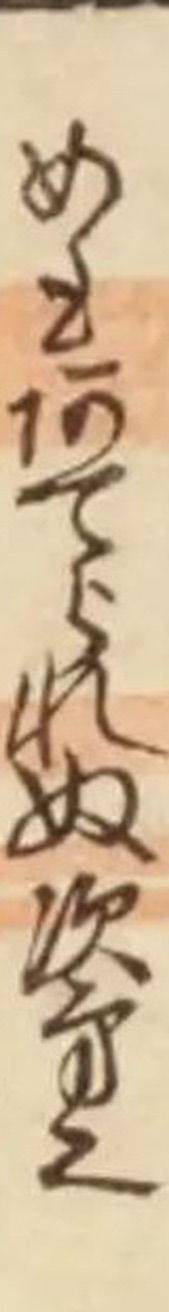めもあてられぬ次第也
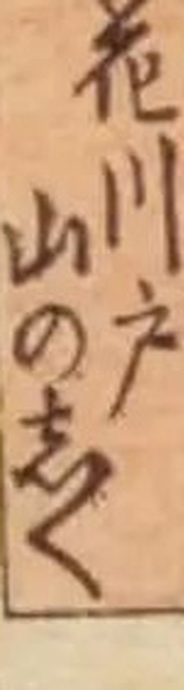山のしく
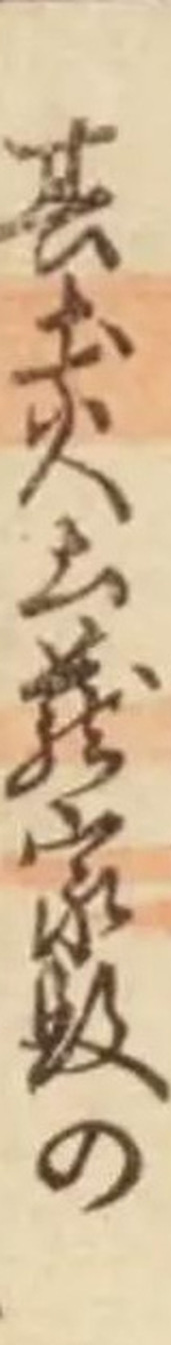其出火土蔵家数の
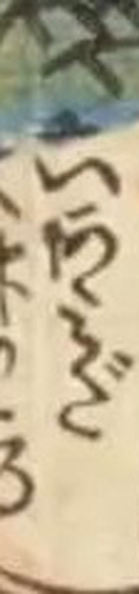六あみだ
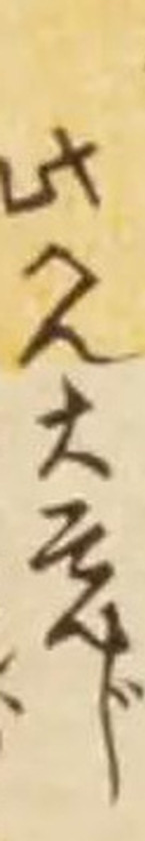此へん大そんじ
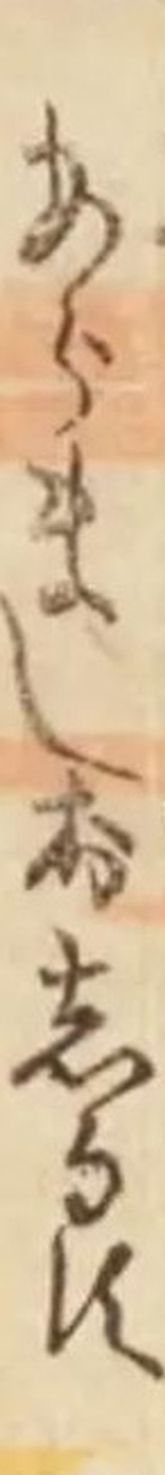あらましおしるす
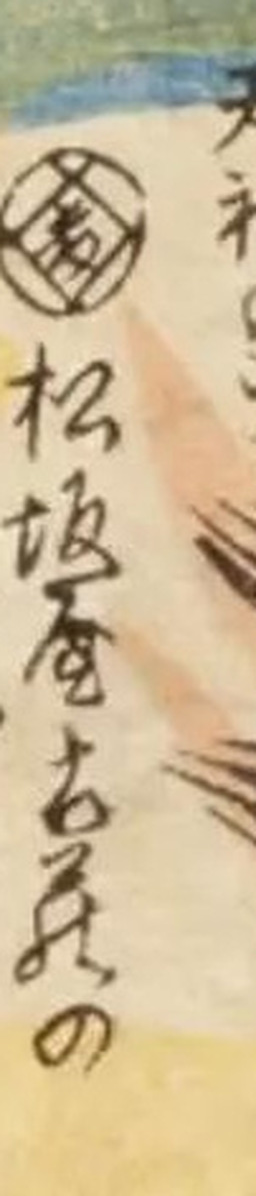松坂屋古藏の
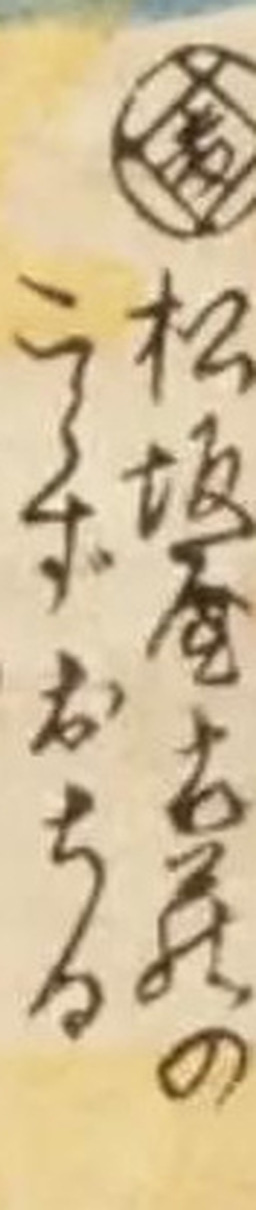こらずおちる
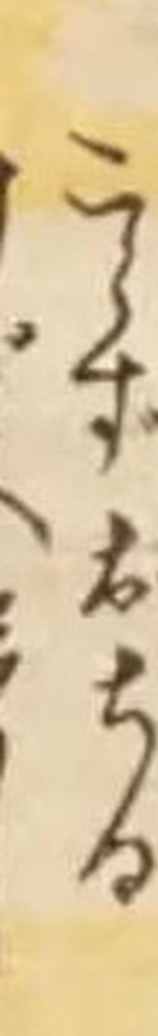こらずおちる
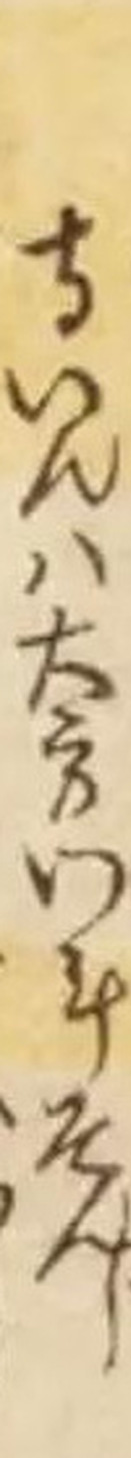寺いんは大方門計そんじ
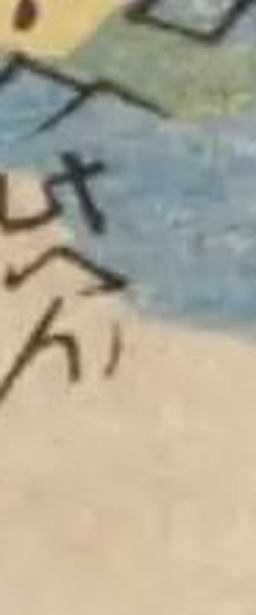此へん
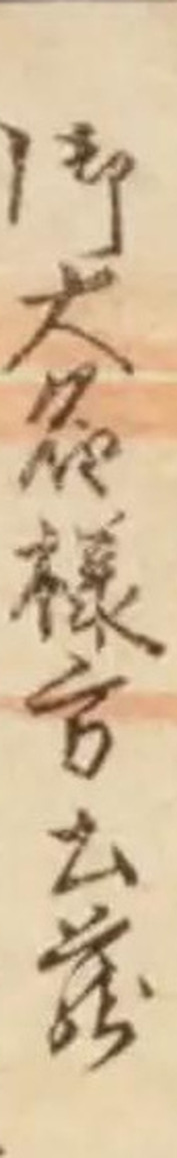御大名様方土藏
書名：銘細改板江戸大地震出火場所附
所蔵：国立国会図書館 National Diet Library, JAPAN
